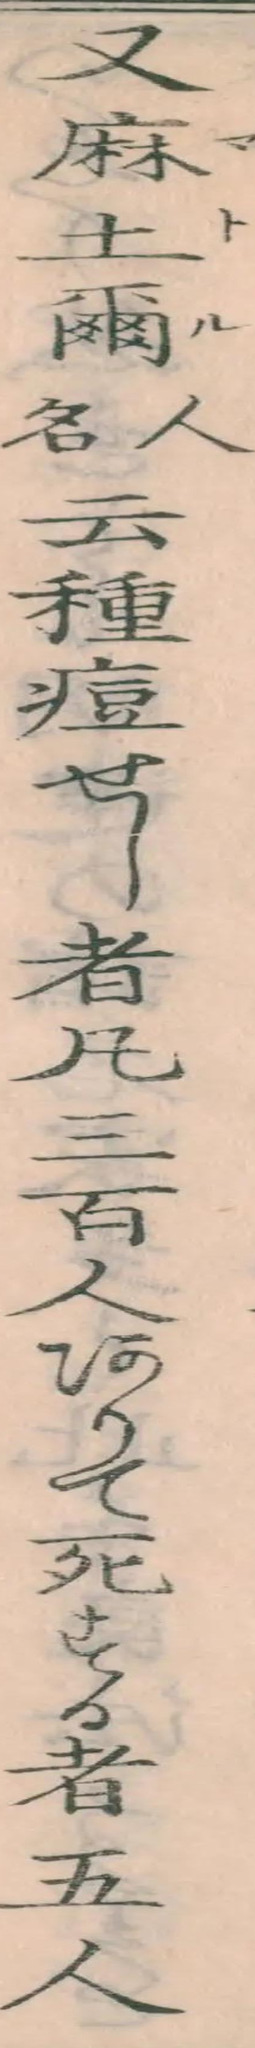又麻土爾人名云種痘せし者凡三百人ありて死する者五人
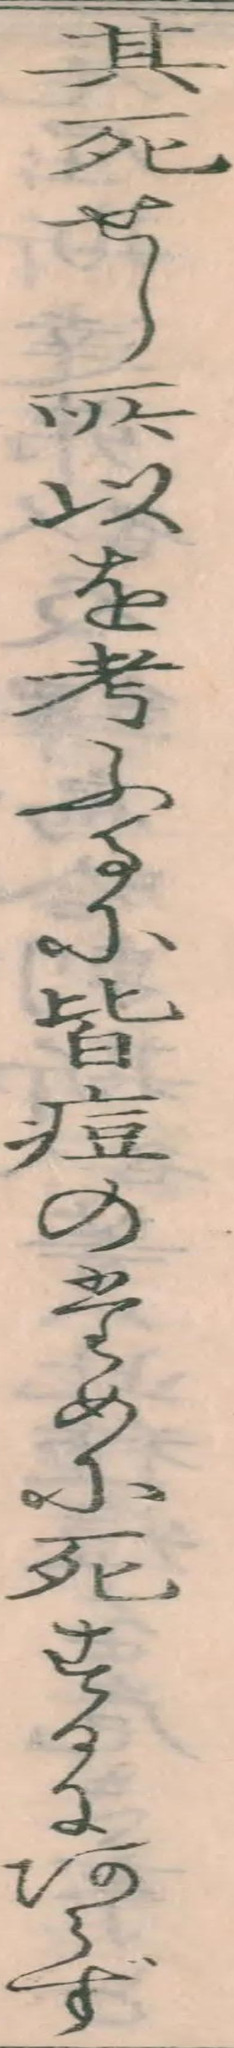其死せし所以を考ふるに皆痘のために死するにあらず
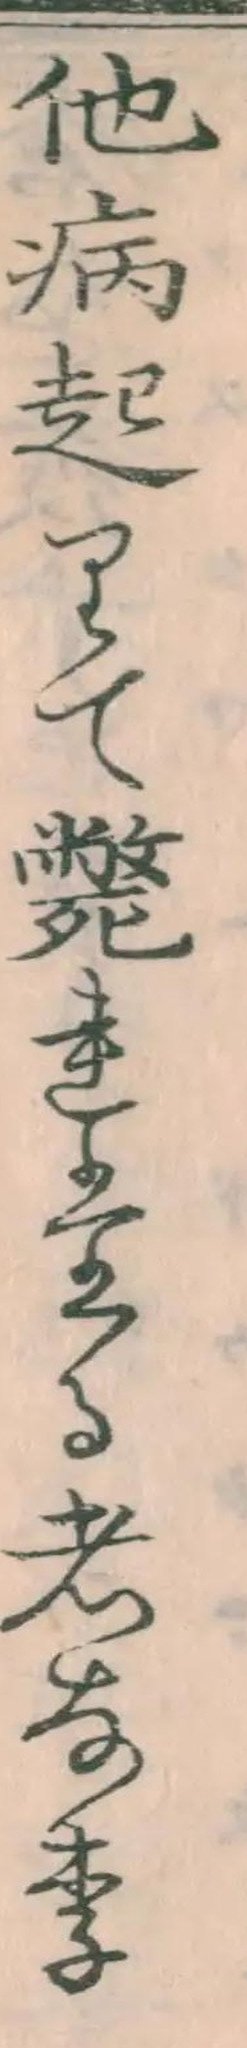他病起りて斃れたる者なり
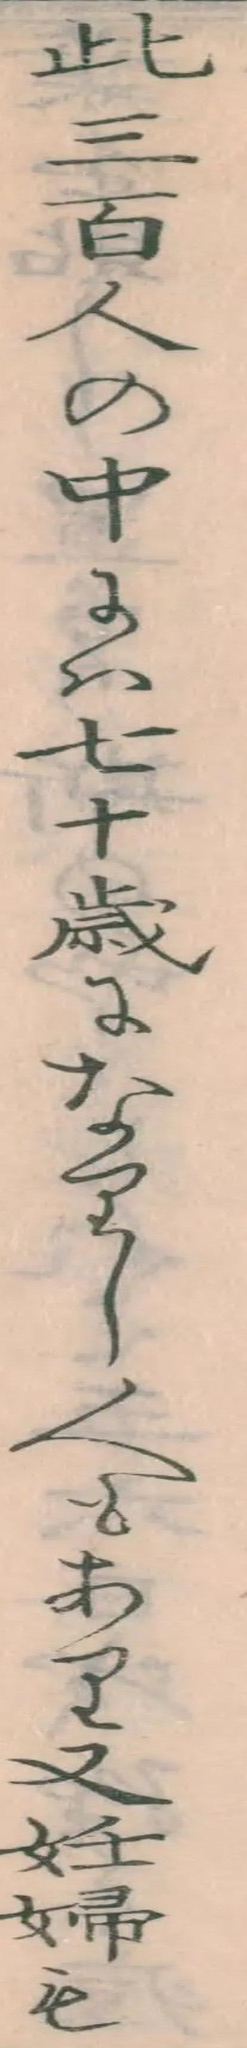此三百人の中には七十歳になりし人もあり又妊婦も
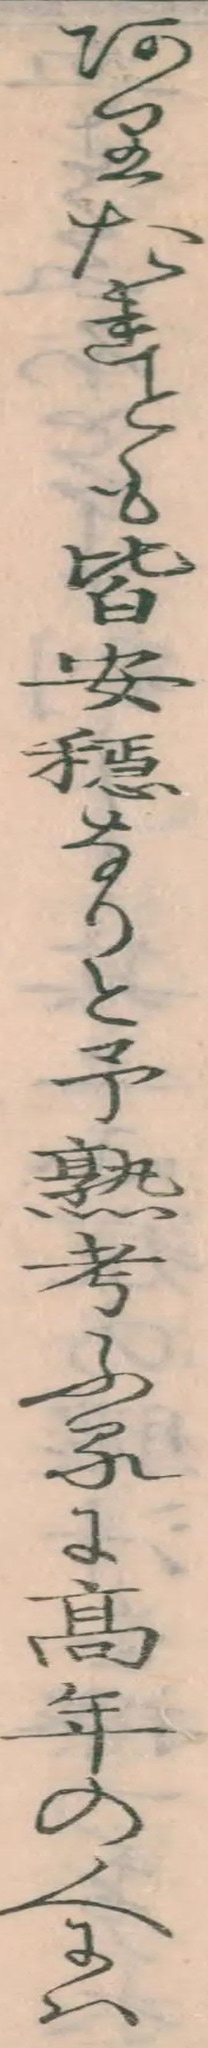ありたれとも皆安穏なりと予熟考ふるに高年の人には
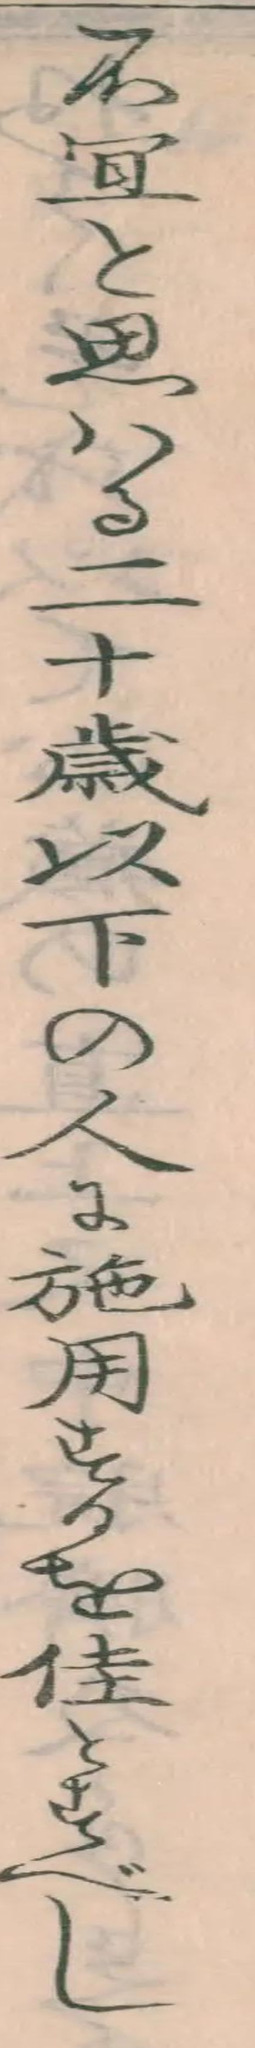不宜と思はる二十歳以下の人に施用するを佳とすべし
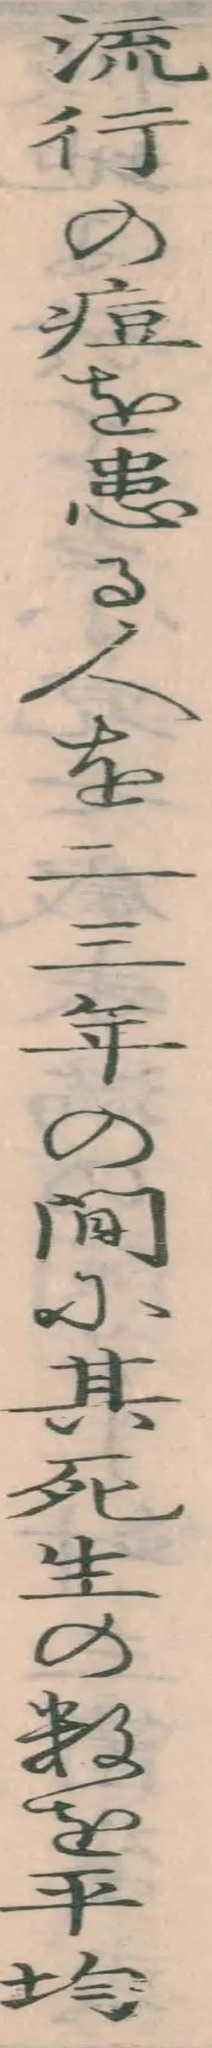流行の痘を患る人を二三年の間に其死生の数を平均
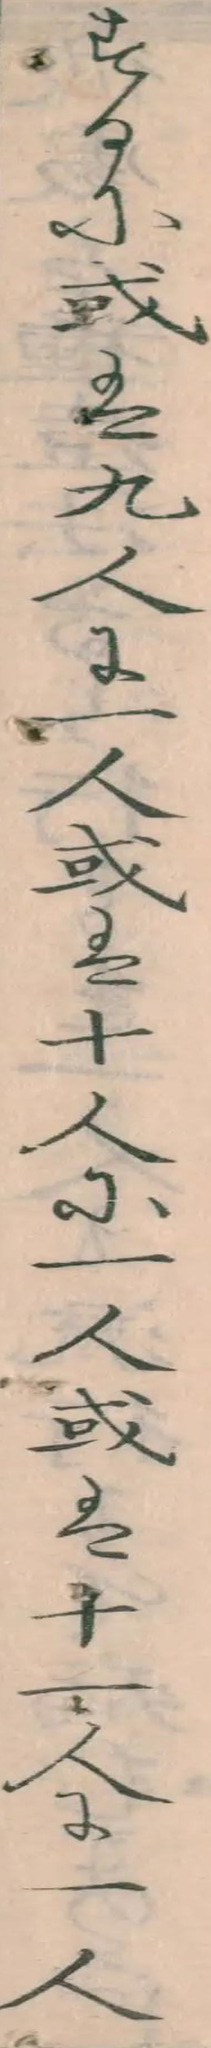するに或は九人に一人或は十人に一人或は十一人に一人
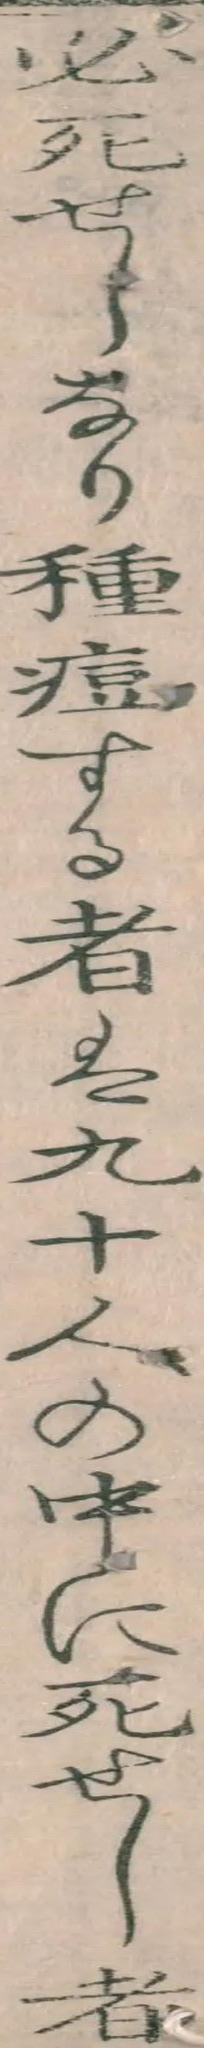必死せしなり種痘する者は九十人の中に死せし者
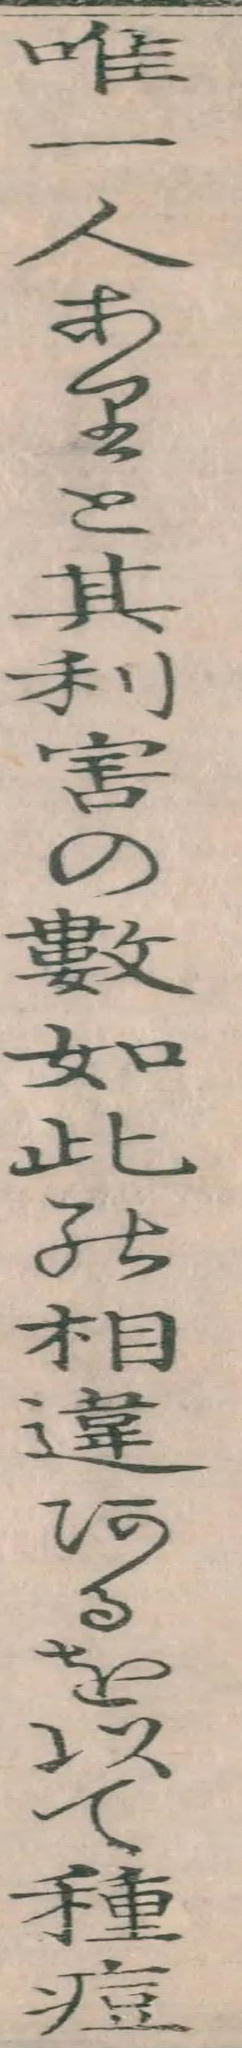唯一人ありと其利害の數如此の相違あるを以て種痘
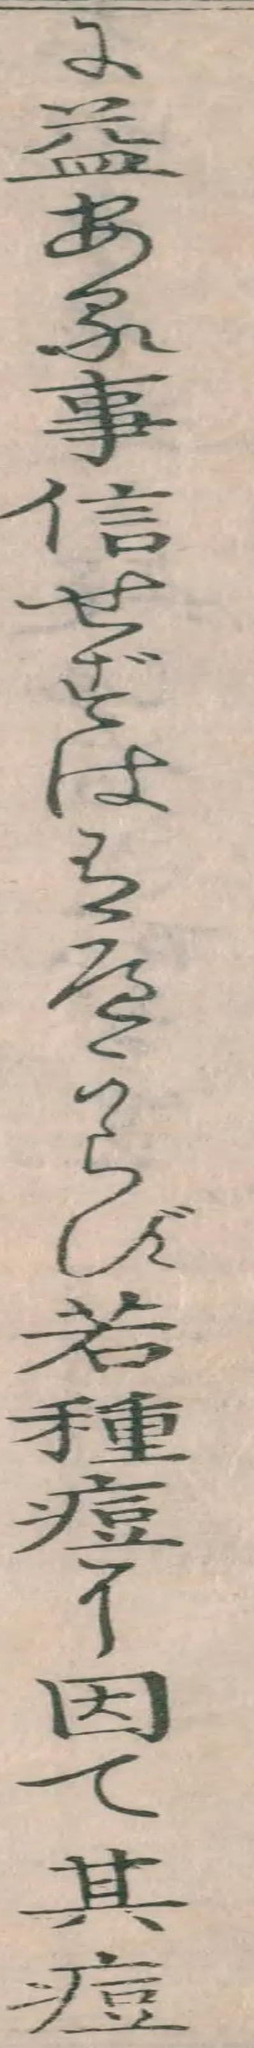に益ある事信せずは有へからず若種痘に因て其痘
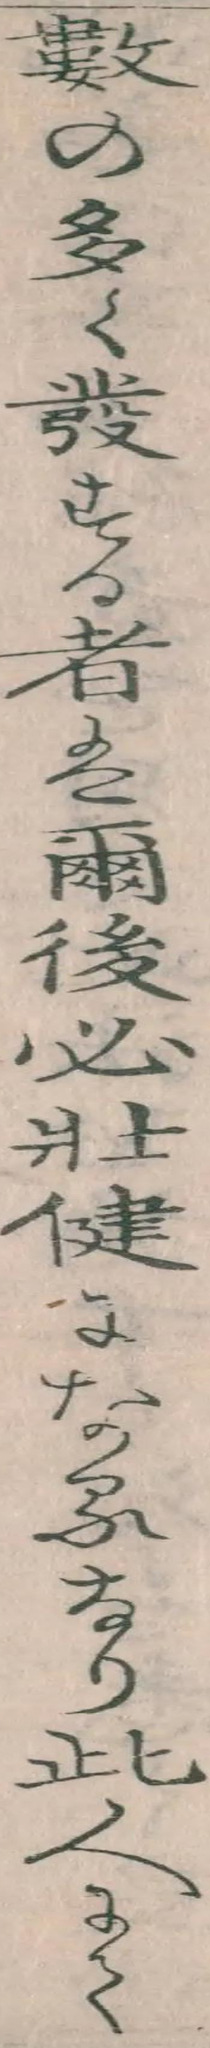數の多く發する者は爾後必壮健になるなり此人にて
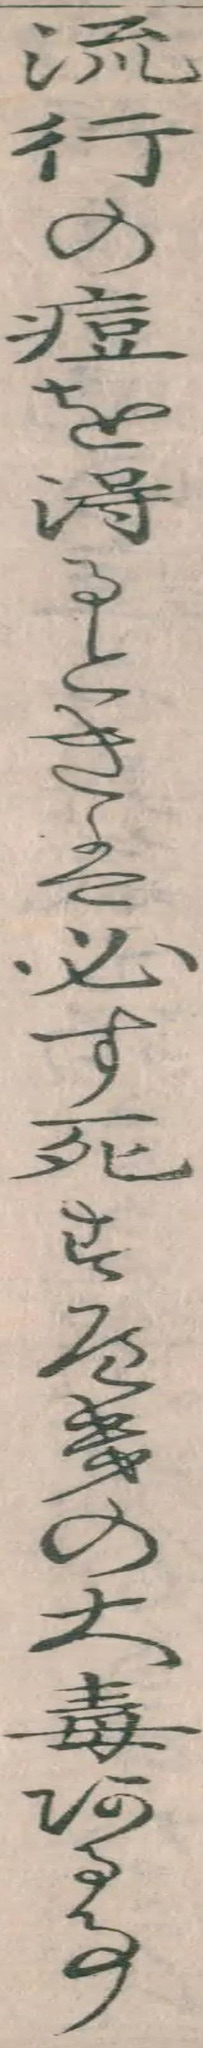流行の痘を得るときは必す死すへきの大毒ある事
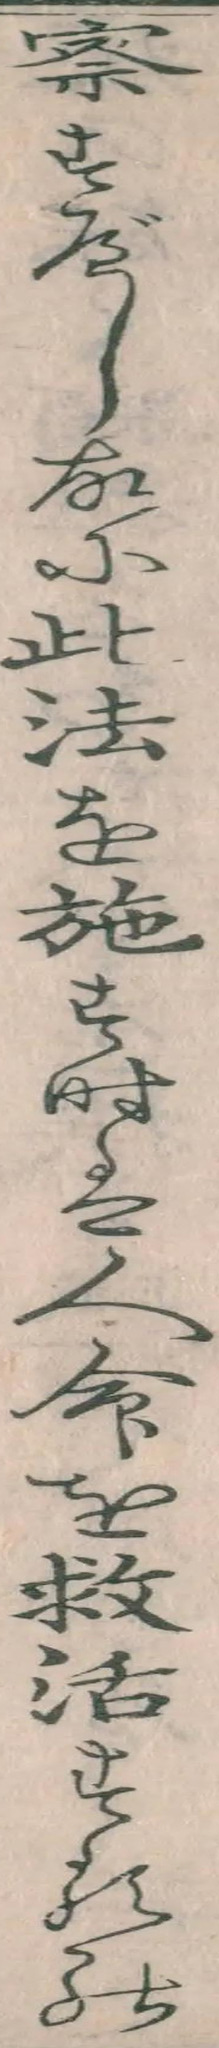察すべし故に此法を施す時は人命を救活すれの
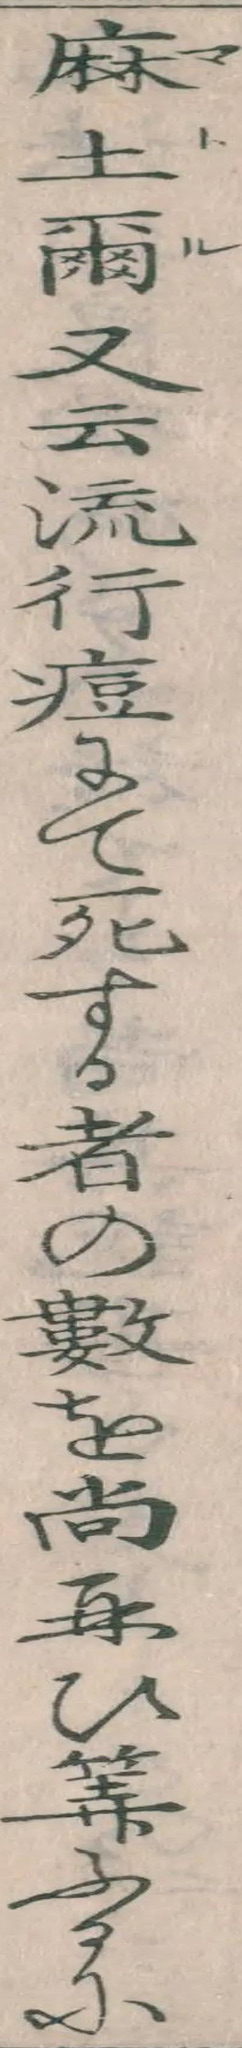麻土爾又云流行痘にて死する者の數を尚再ひ筭ふるに
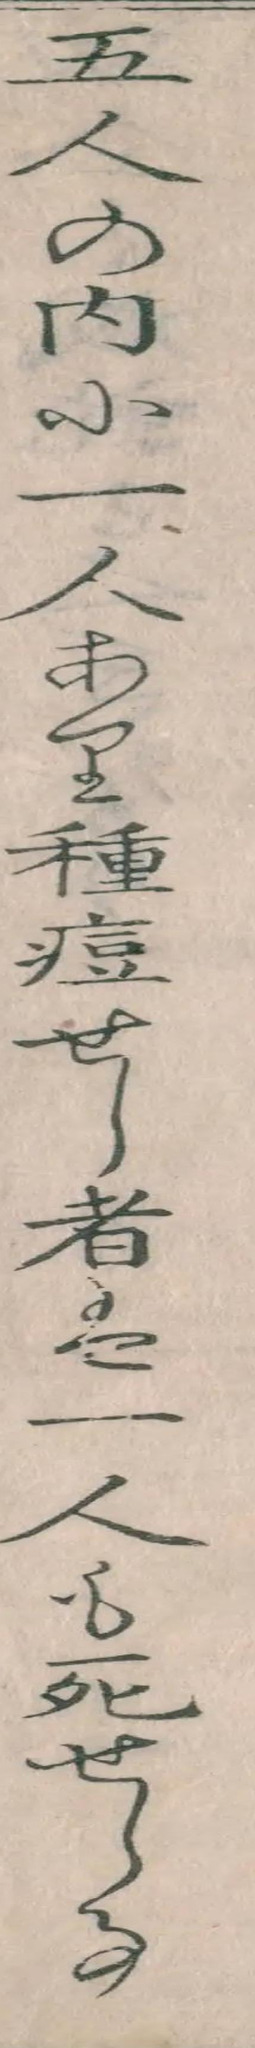五人の内に一人あり種痘せし者は一人も死せし事
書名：種痘新編
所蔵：国立国会図書館 National Diet Library, JAPAN
